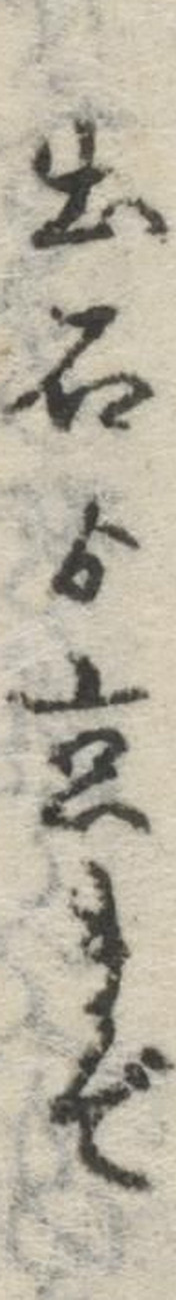出石ゟ京まで
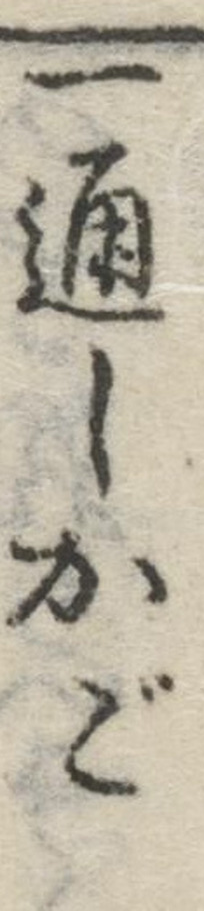一通しかご
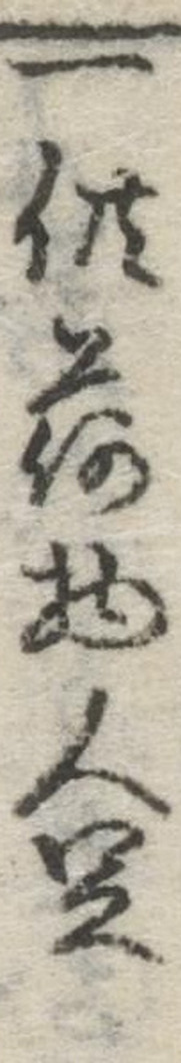一供荷物人足
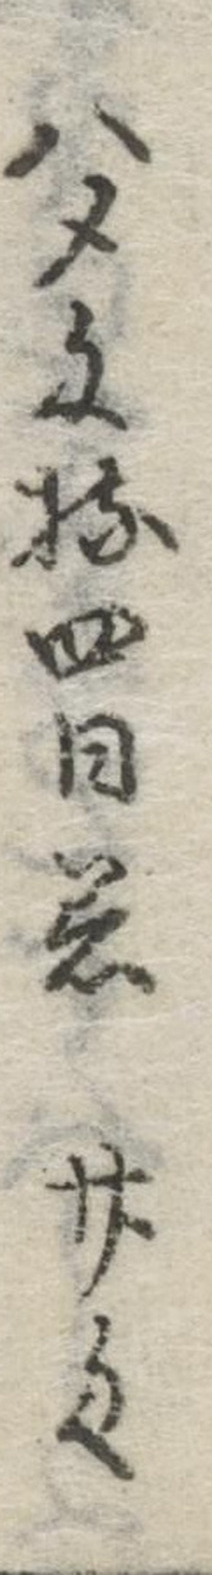八貫匁持四日着廿匁
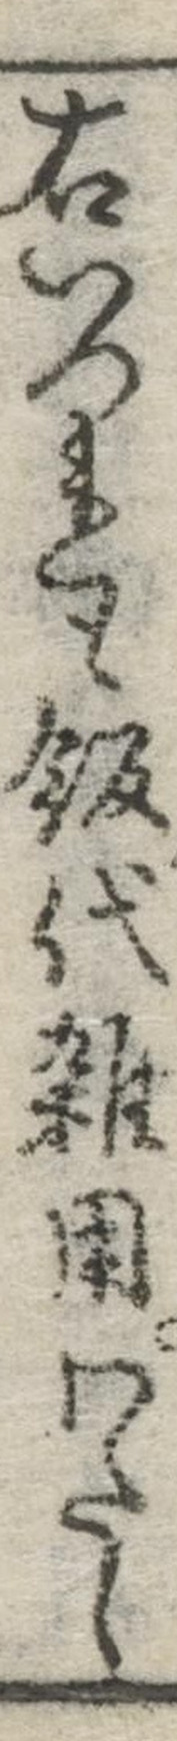右いつれも飯代雑用。わたし
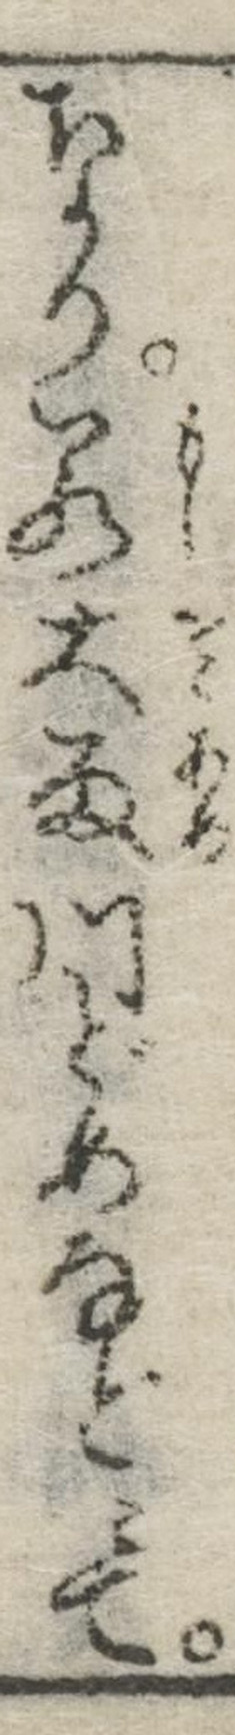なり。若大雨川どめなどニて。
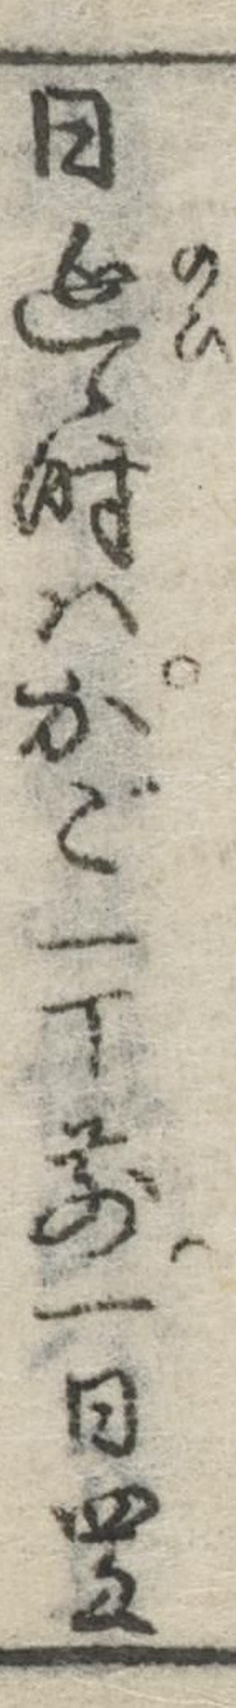日延候時は。かご一丁前。一日四匁
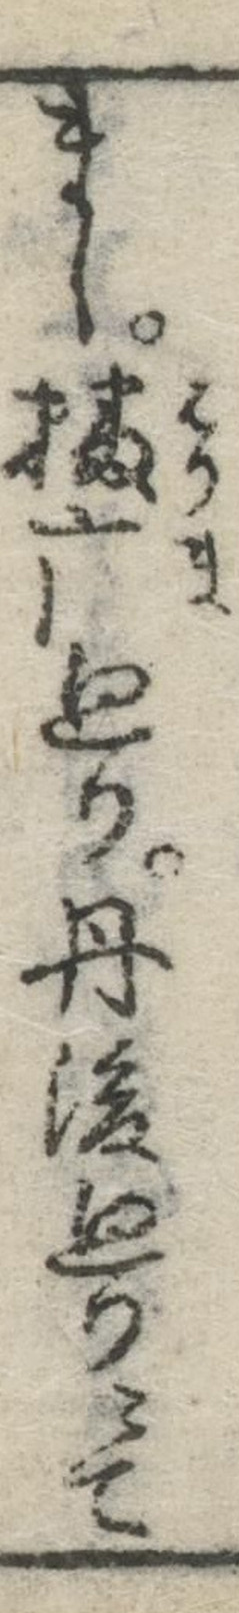まし。播磨廻り。丹後廻りニて
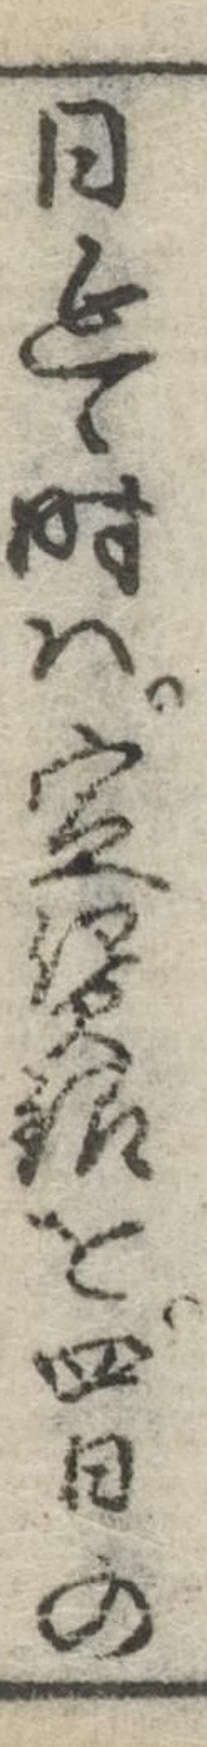日延候時は。定賃銀を。四日

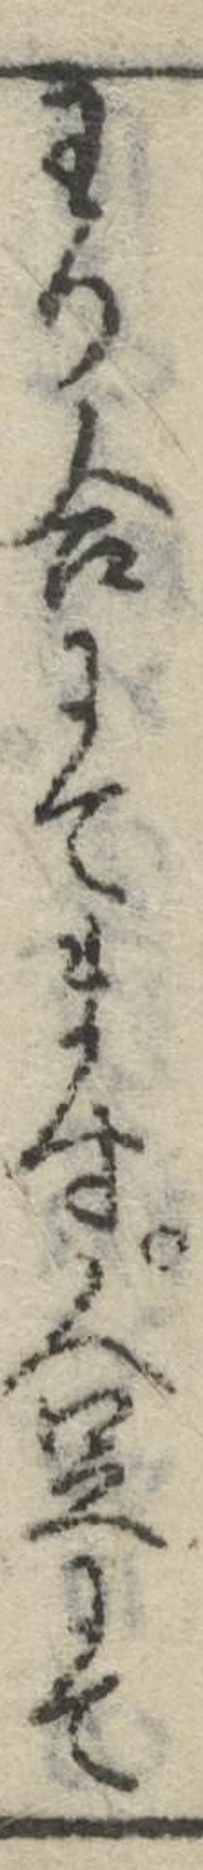わり合にてます。人足にて
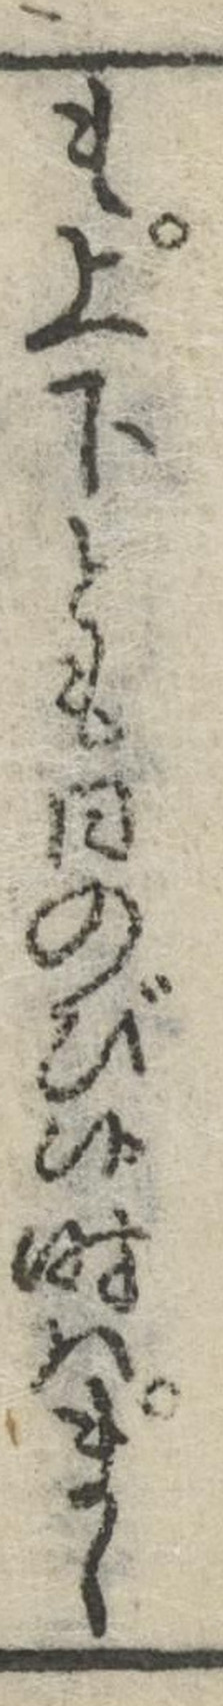も。上下とも日のび候時は。まし
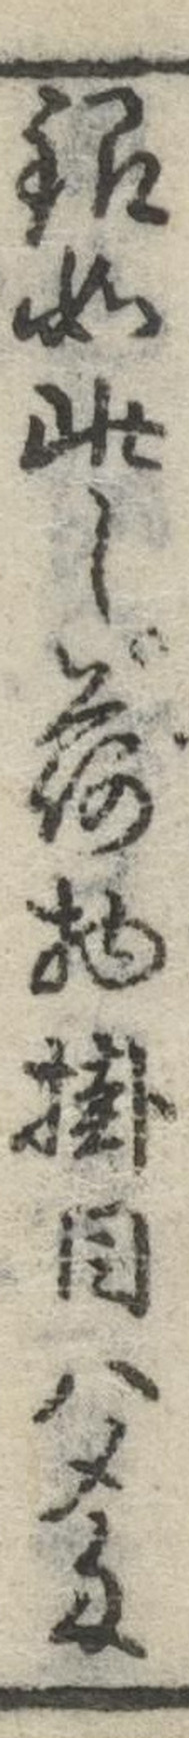銀如此し。荷物掛目八十匁
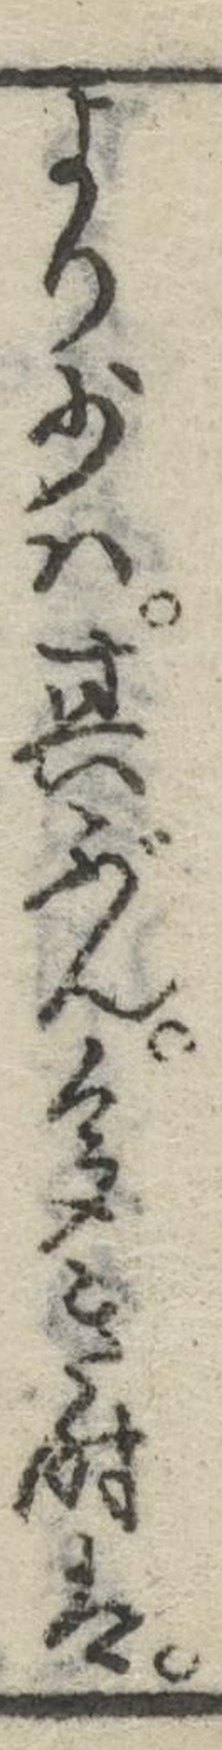より少は。其ぶん。多き時は。
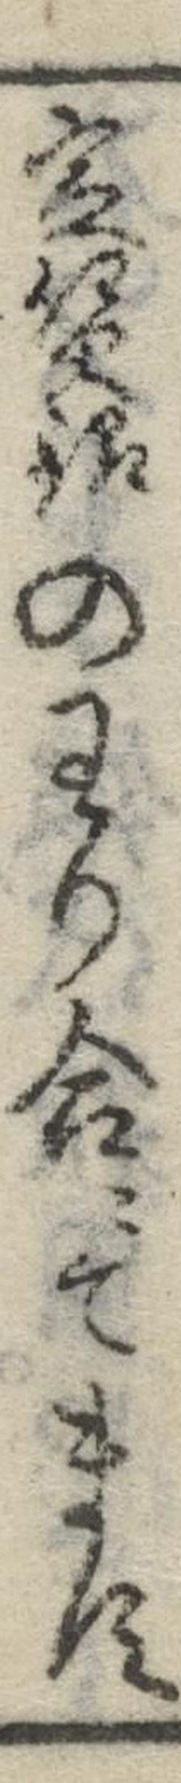定賃銀のわり合にてます。
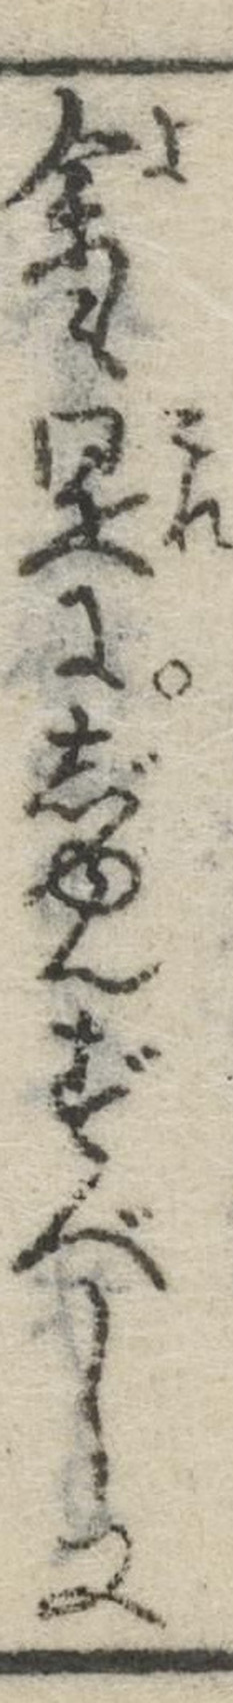余も是に。じゆんずべし又
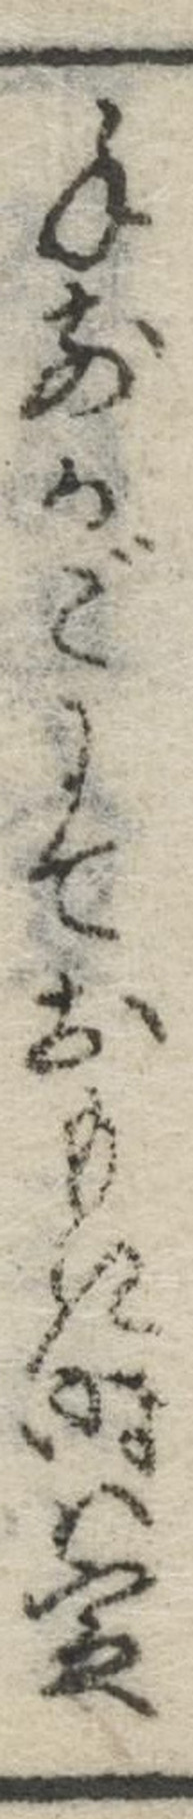手前かごにておもき時は定
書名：但州城崎浴湯辧
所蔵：東京大学地震研究所図書室 Earthquake Research Institute Library, The University of Tokyo, JAPAN
